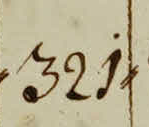321
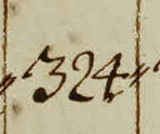324
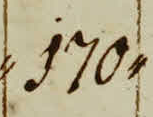170
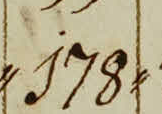178
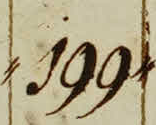199
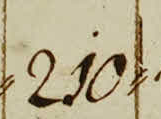210
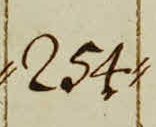254
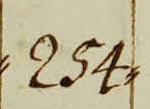254
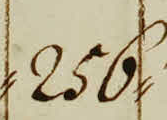256
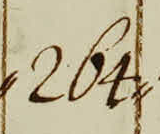264
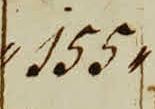155
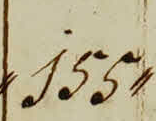155
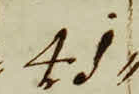41
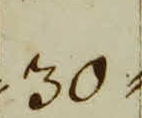30
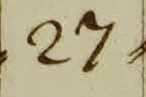27
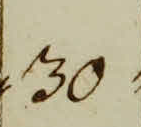30
